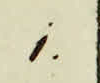1.
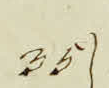35
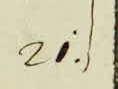21.
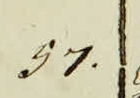57.
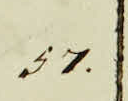57.
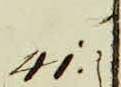41.
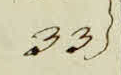33
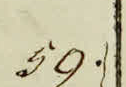59.
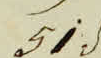51
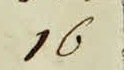16
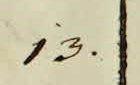13.
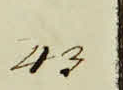43
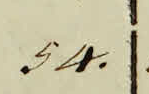54.
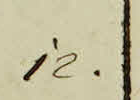12.
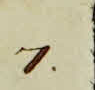7.
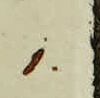1.
